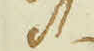8
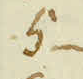5
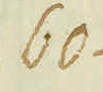60
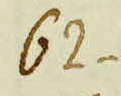62
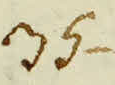35
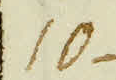10
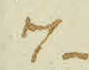7
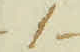1
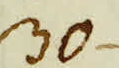30
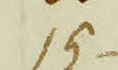15
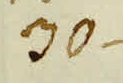30
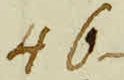46
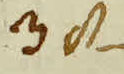38
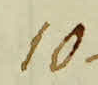10
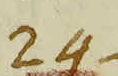24
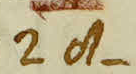28
